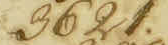3621.
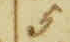5
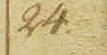24.
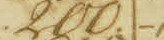200.
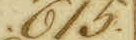615.
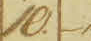10.
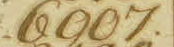6907.
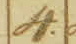4.
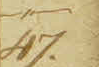47.
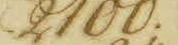2100.
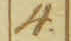4.
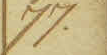77.
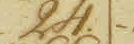24.
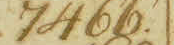7466.
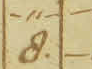8.
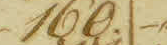160.
